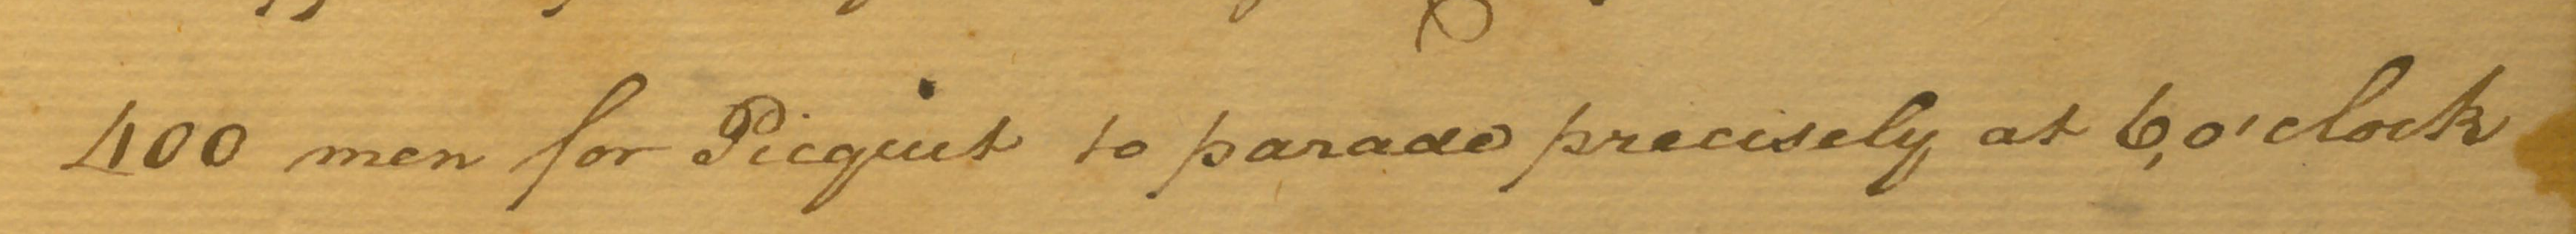400 men for Picquet to parade precisely at 6, o'clock
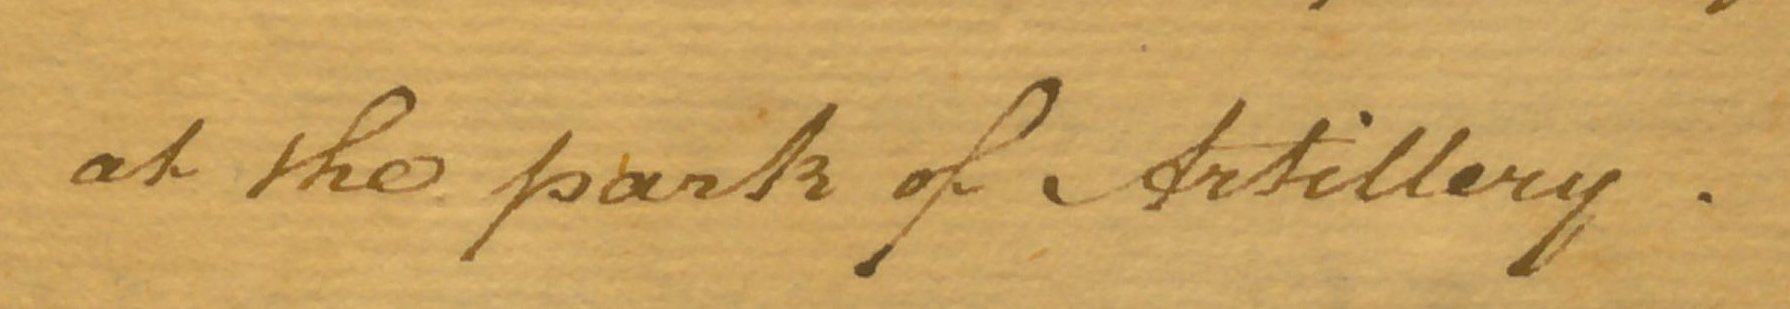at the park of Artillery.
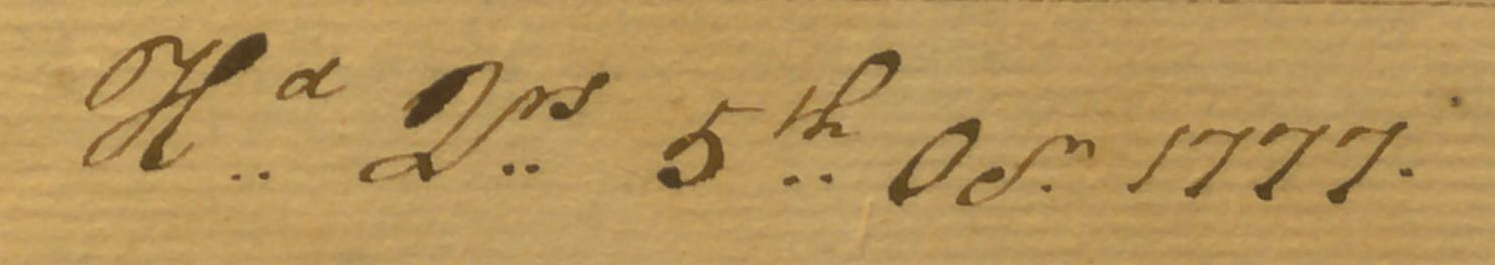H^d. Q^rs. 5^th. Oc^r. 1777.
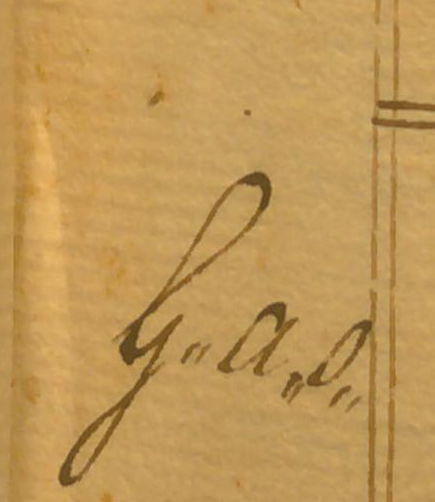G.A.O.
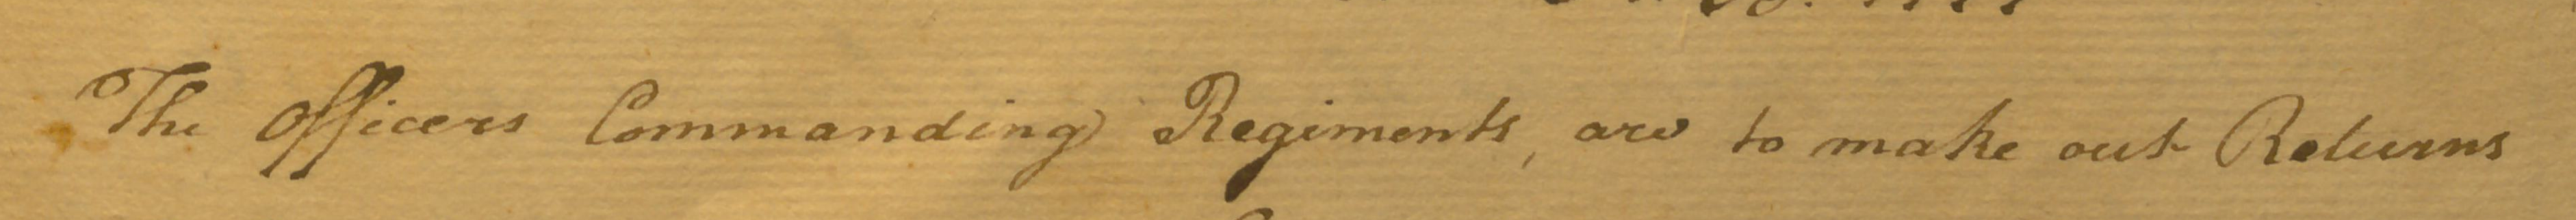The officers Commanding Regiments are to make out Returns
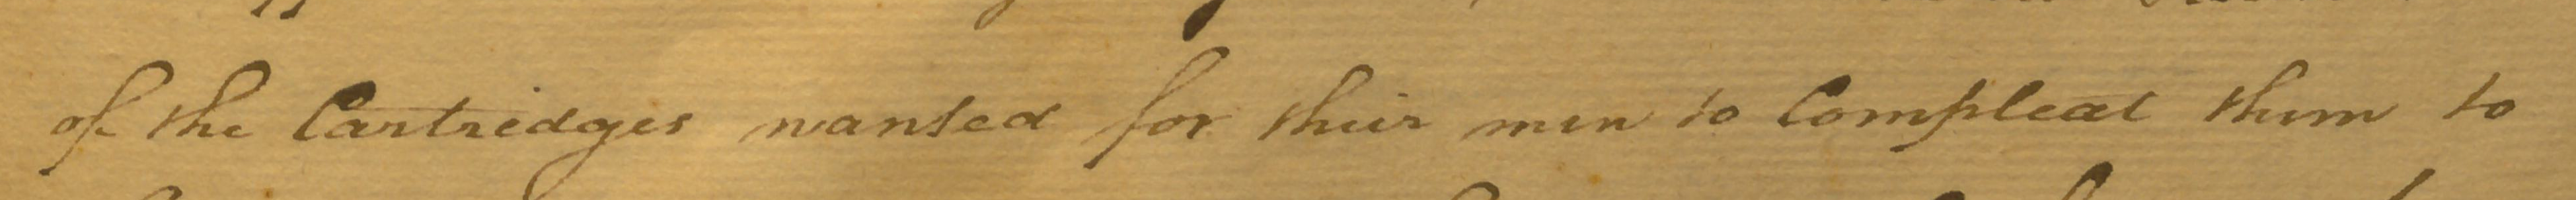of the Cartridges wanted for their men to Compleat them to
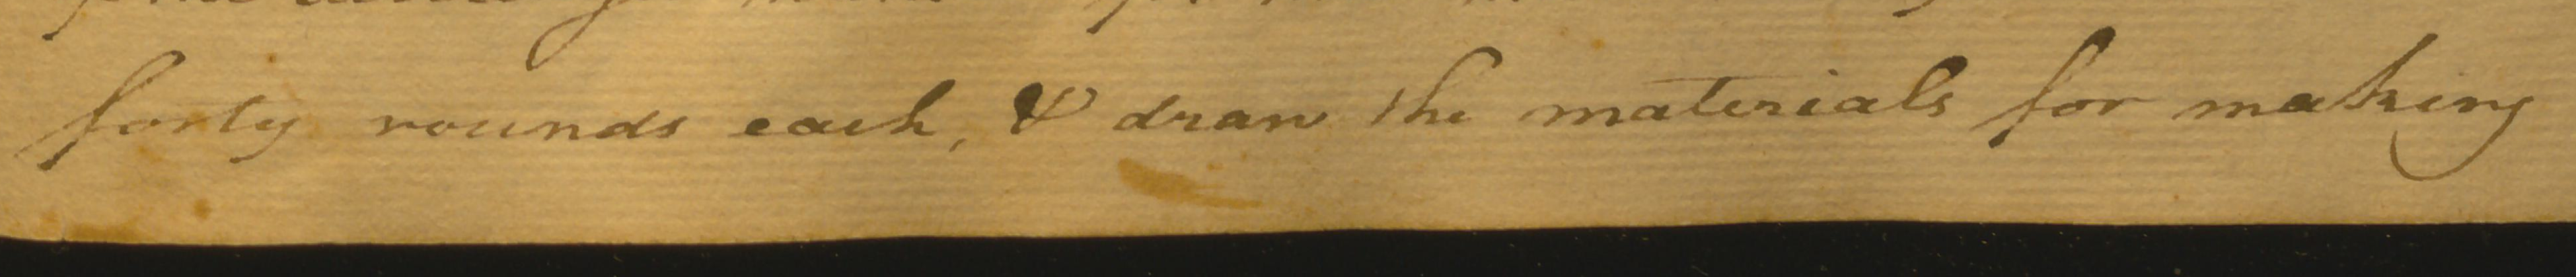forty rounds each, & draw the materials for making
